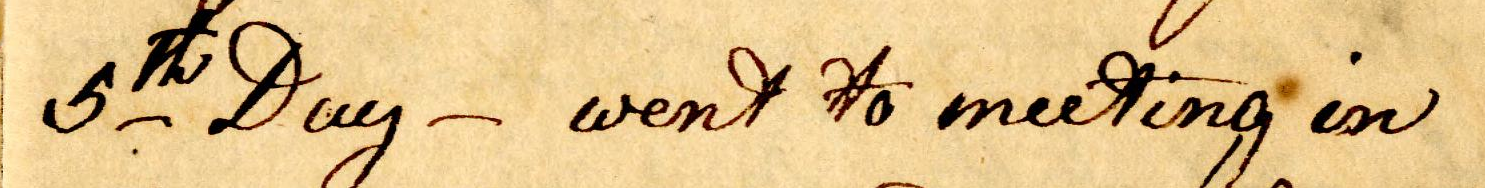5^th Day- went to meeting in
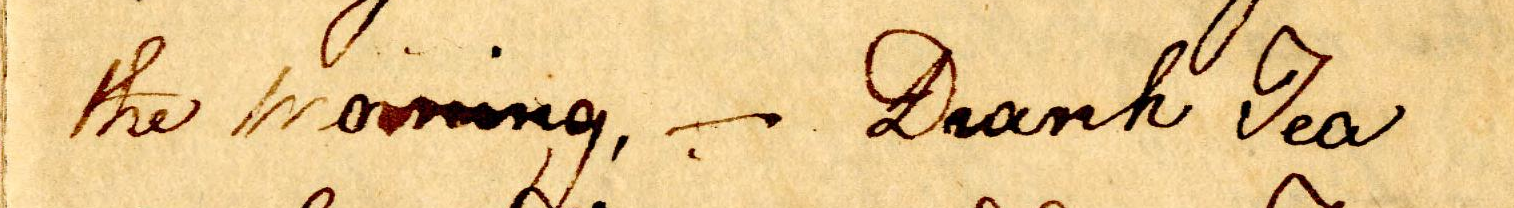the morning,- Drank Tea
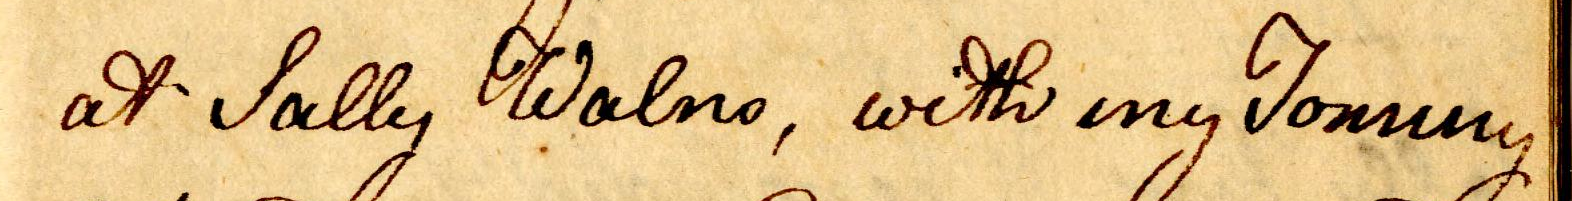at Sally Walns, with my Tommy
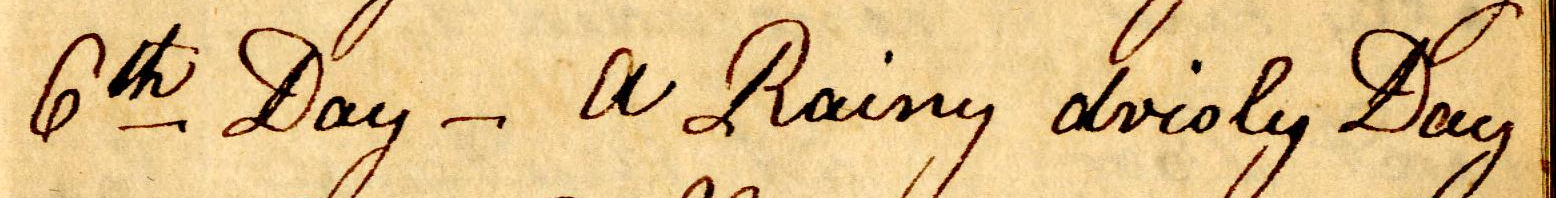6^th Day- A Rainy drisly Day
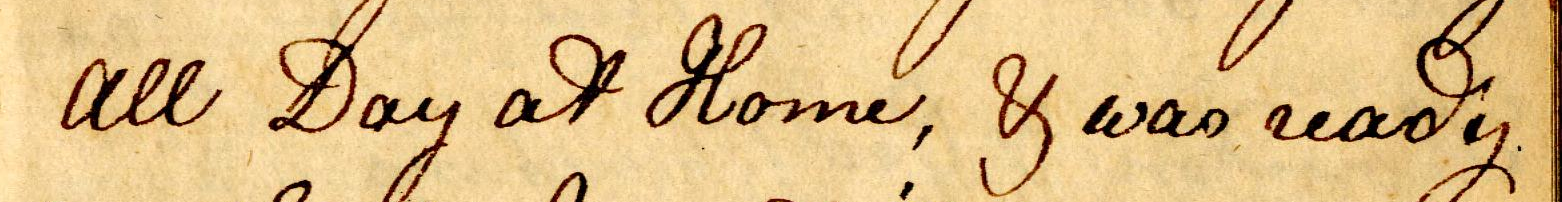All Day at Home, & was ready
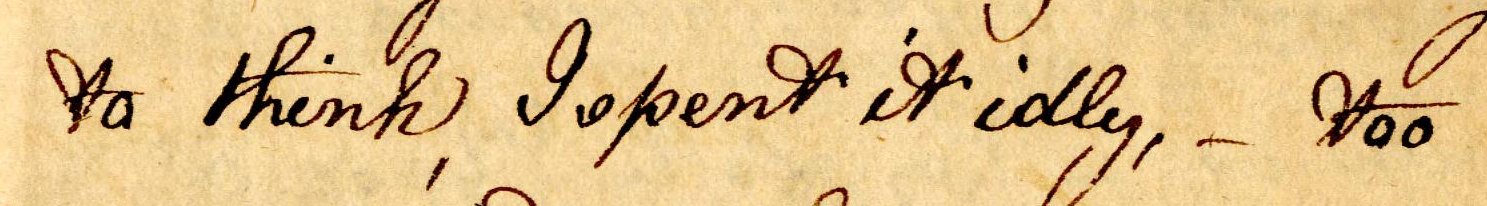to think, I spent it idly,- too
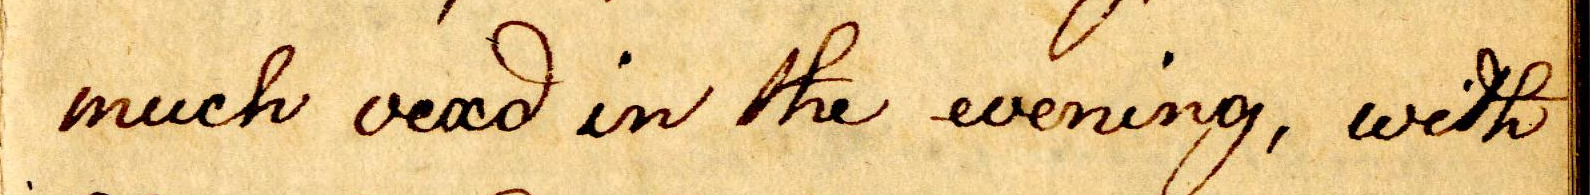much vexd in the evening, with
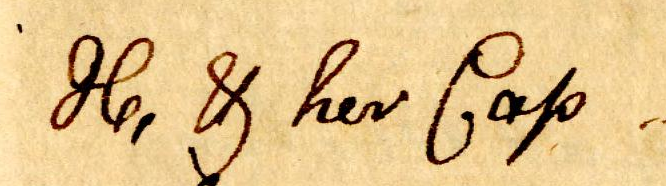H, & her Cap
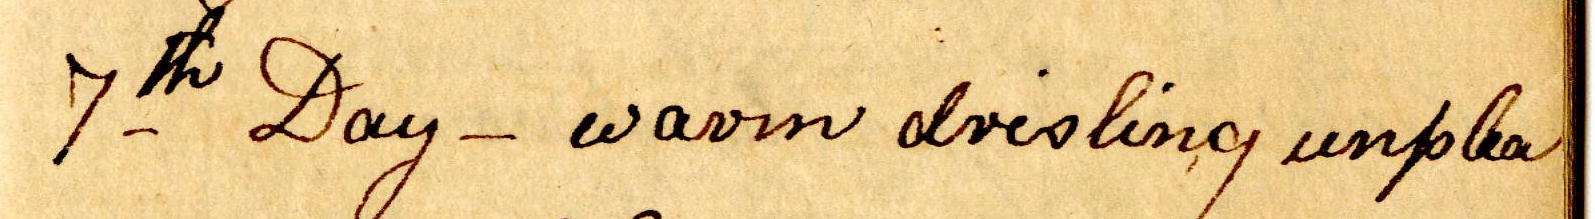7^th Day- warm drisling unplea
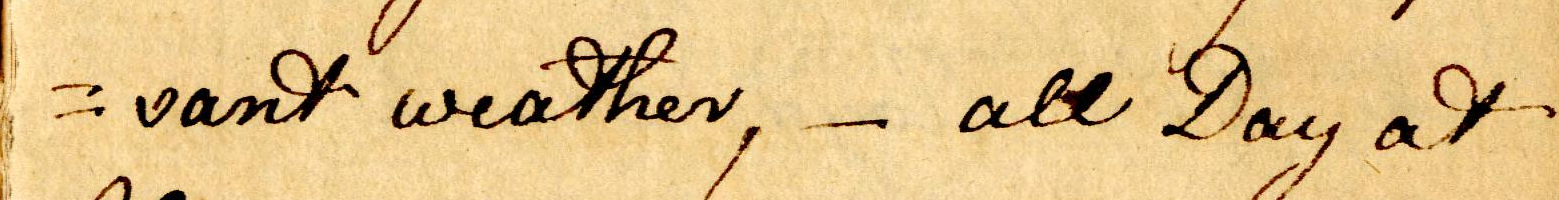-sant weather,- all Day at
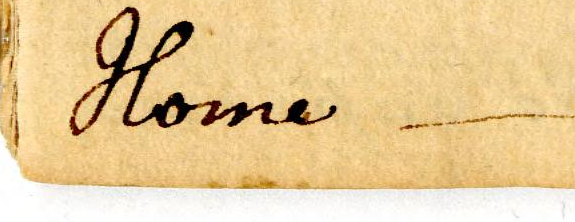Home-
